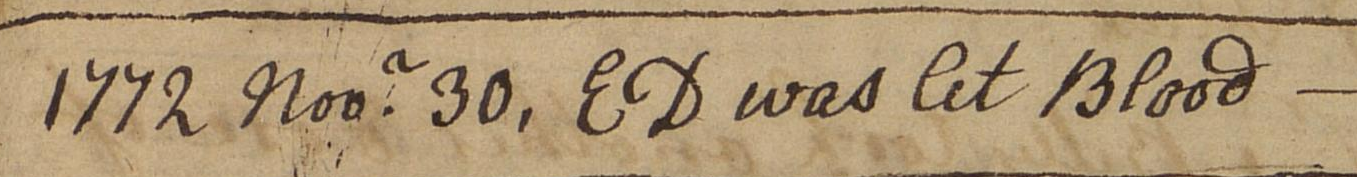1772 Nov^r. 30, ED was let Blood-
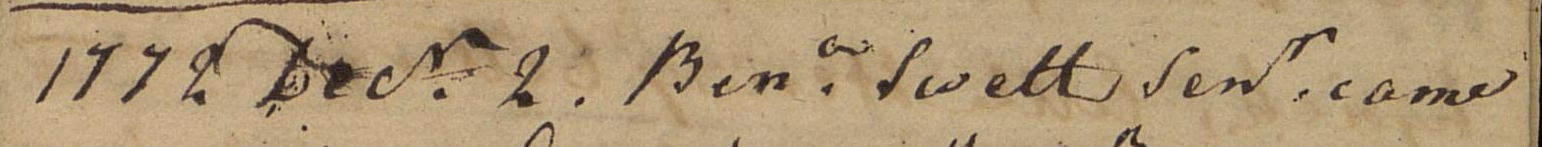1772 Dec^r. 2. Ben^a. Swett Sen^r. came
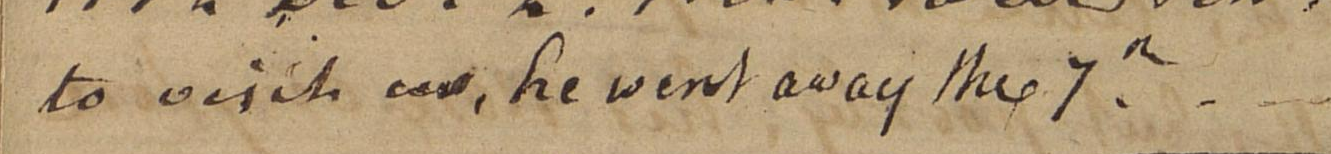to visit us, he went away the 7^th.-
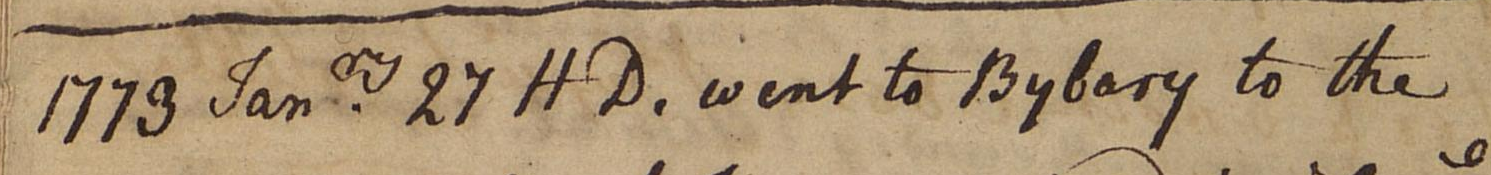1773 Jan^ry. 27 HD. went to Bybary to the
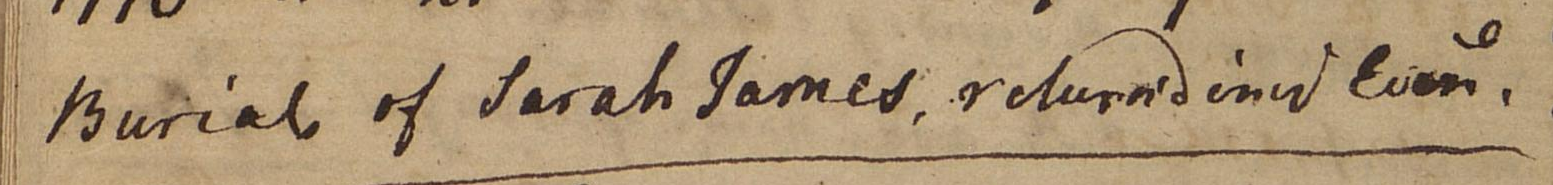Burial of Sarah James, return'd in y^e Even^g.
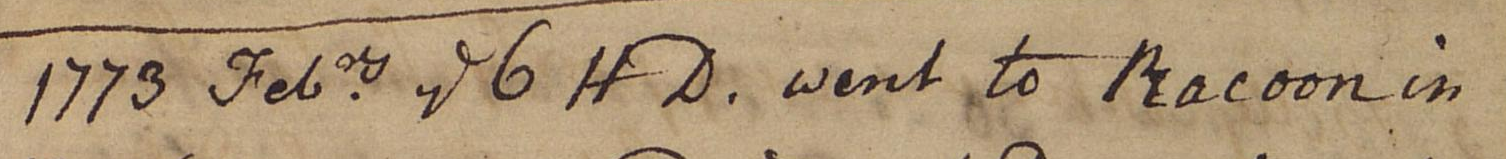1773 Feb^ry. y^e 6 HD. went to Racoon in
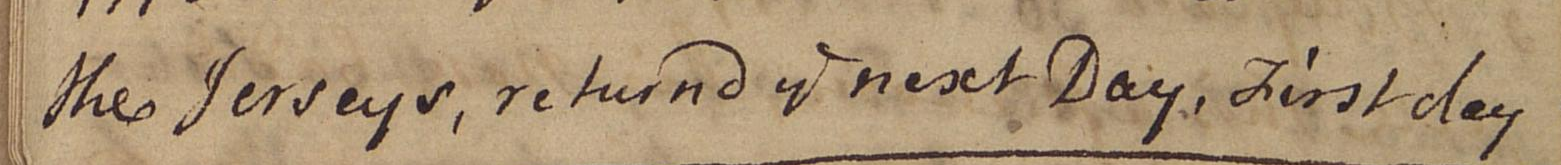the Jerseys, returnd y^e next Day, First day
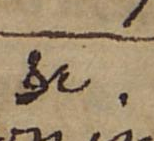&c
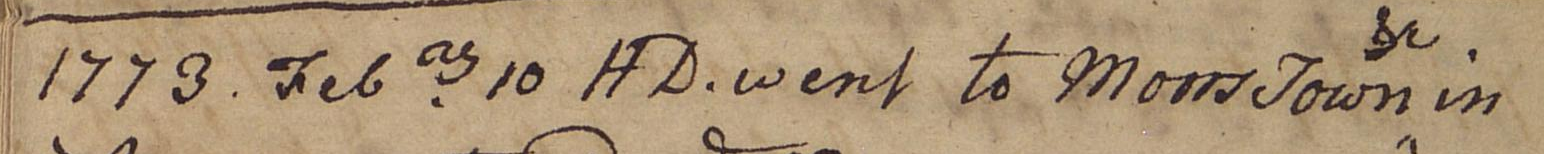1773. Feb^ry. 10 HD. went to Moors Town ^ in
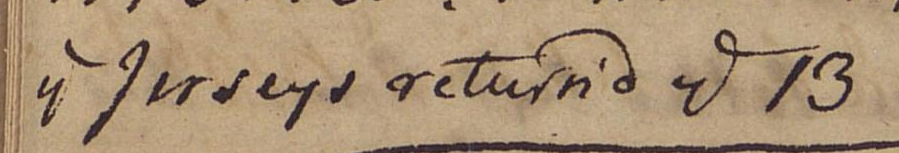y^e Jerseys return'd y^e 13
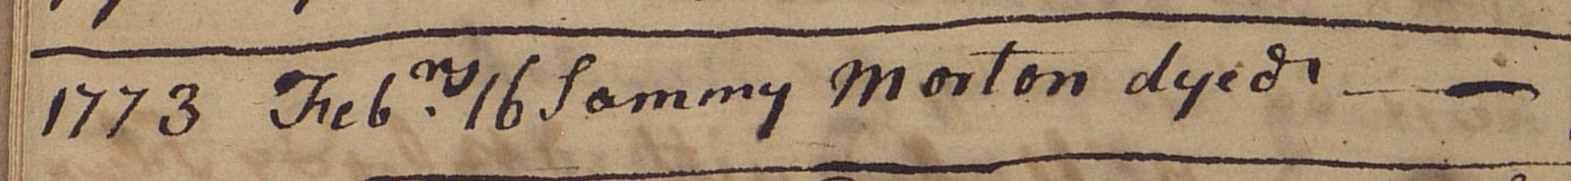1773 Feb^ry. 16 Sammy Morton dyed-
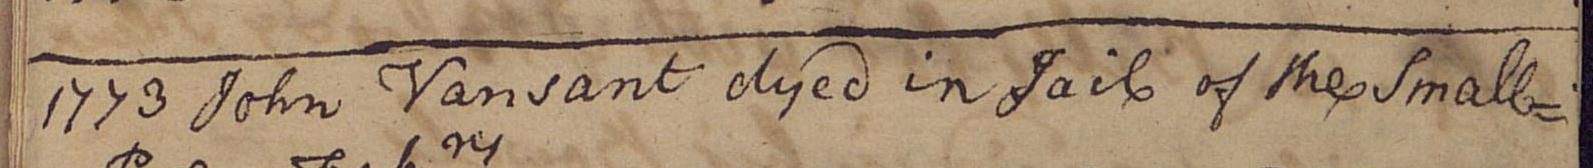1773 John Vansant dyed in Jail of the Small-
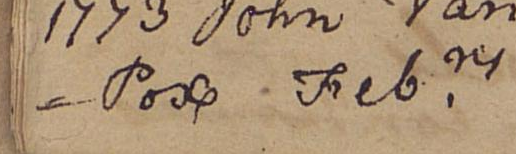-Pox Feb^ry.
